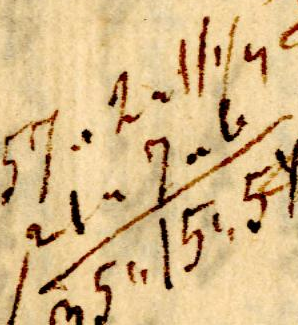21..7..6
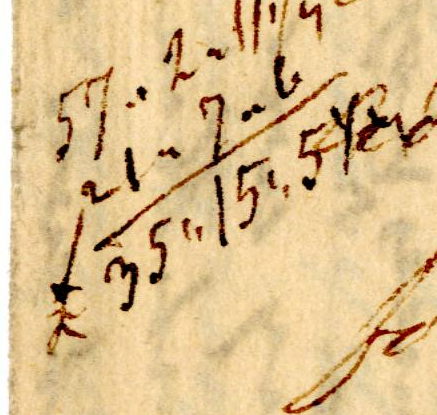35..15..5 1/2
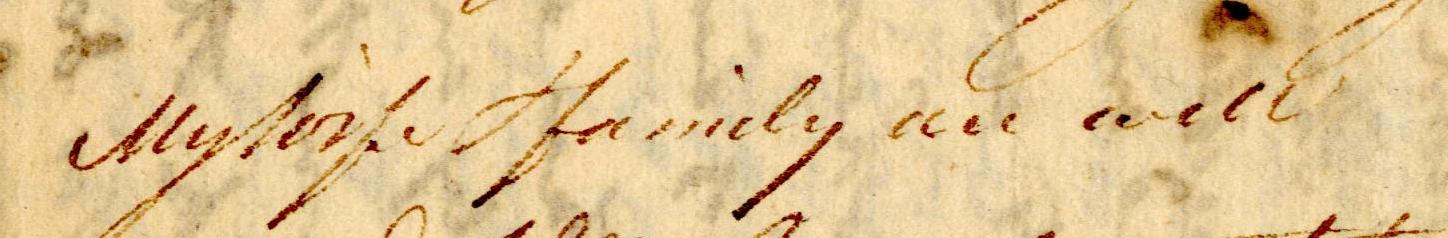My wife & family are well
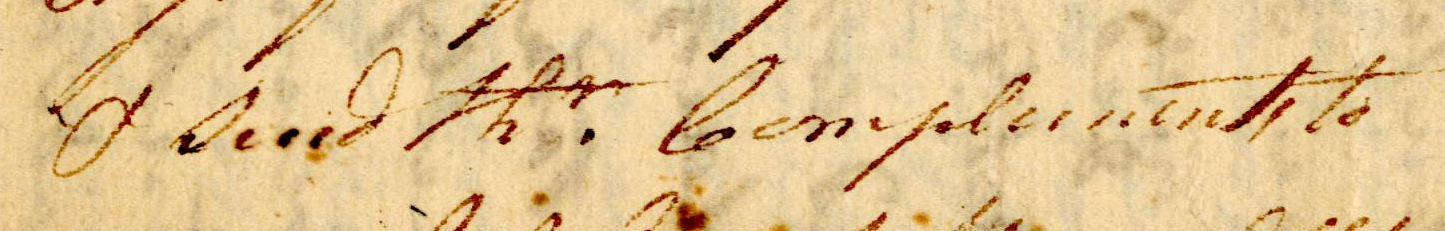& send th^r. Complements to
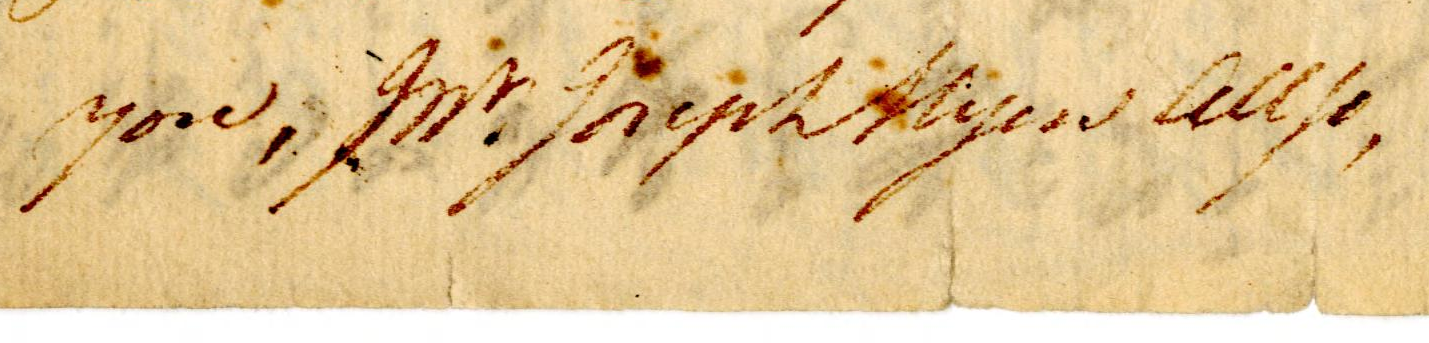you, M^r Joseph Myers allso
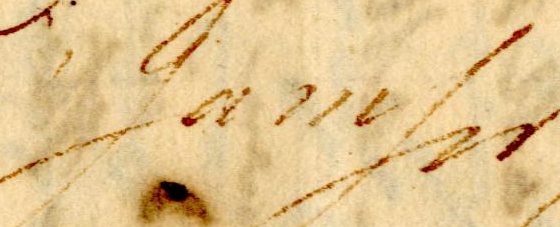I am sir
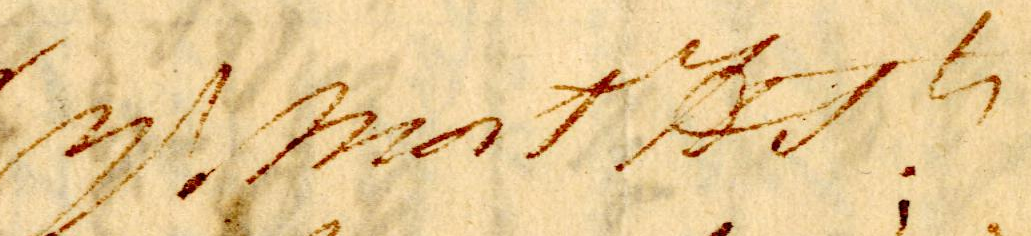Y^r most H s^t.
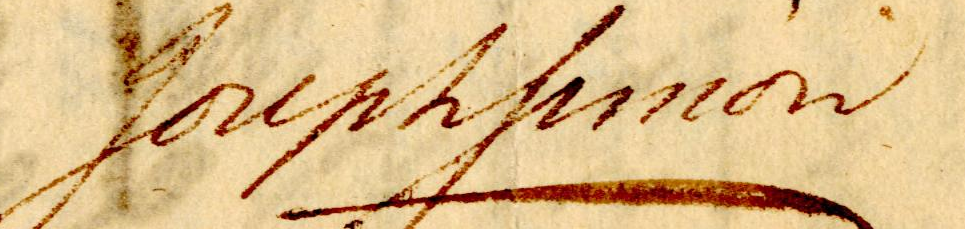Joseph Simon
